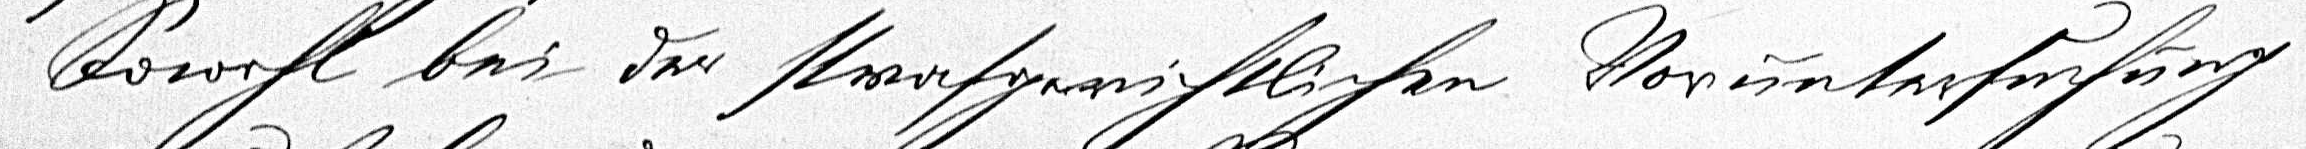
Sowohl bei der Strafgerichtliche Voruntersuchung
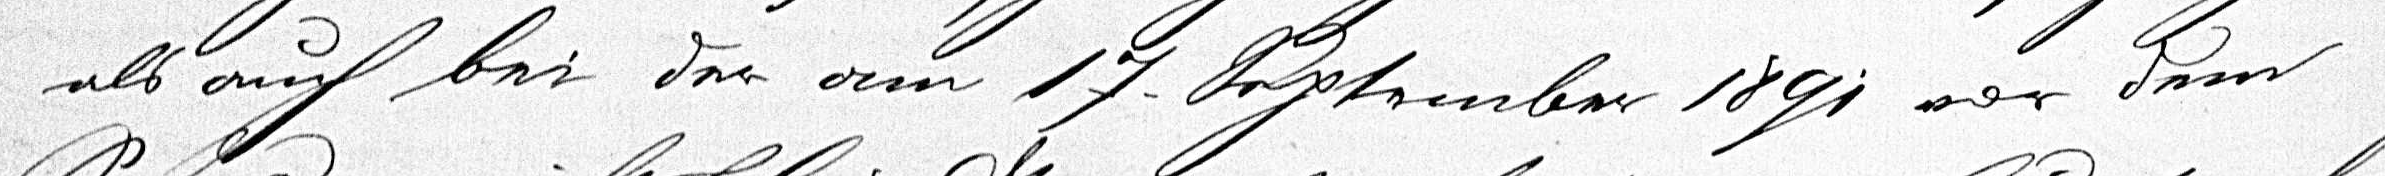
als auch bei der am 17. September 1891 vor dem
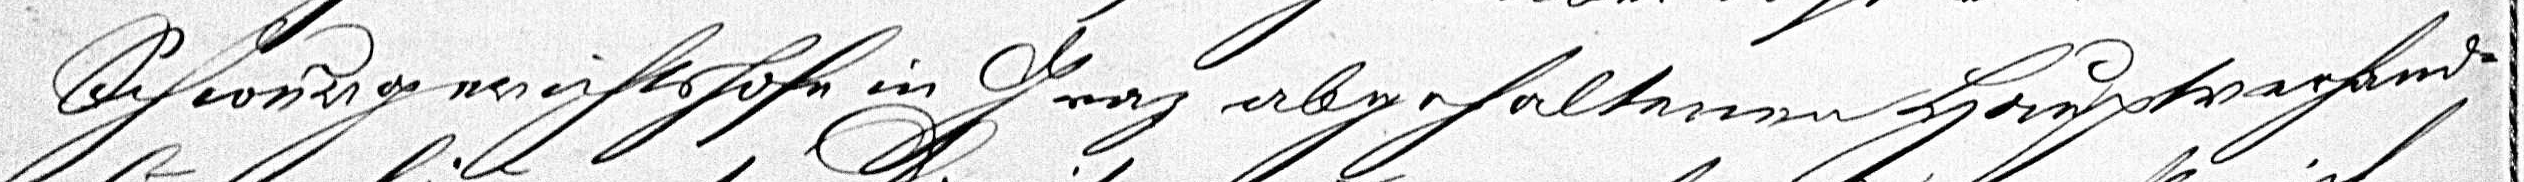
Schwurgerichtshofe in Graz abgehaltenen Hauptverhand¬
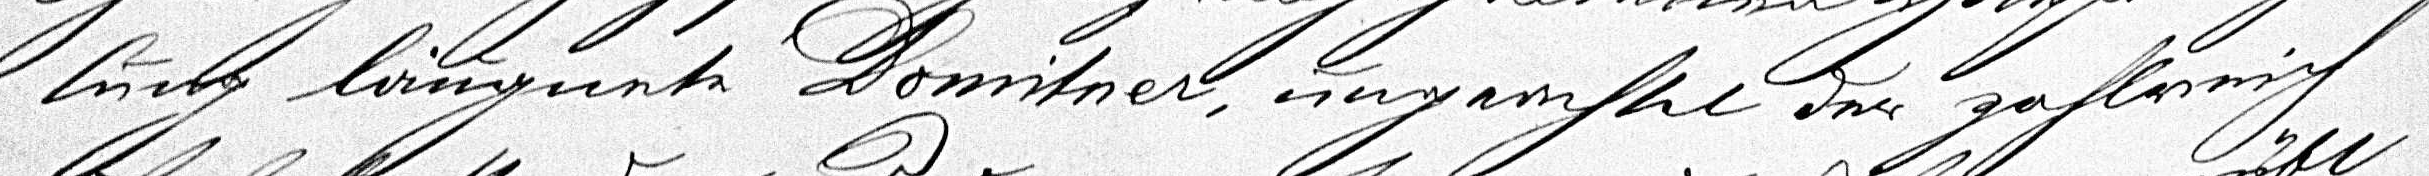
lung läugnete Domitner, ungeachtet der zahlreich
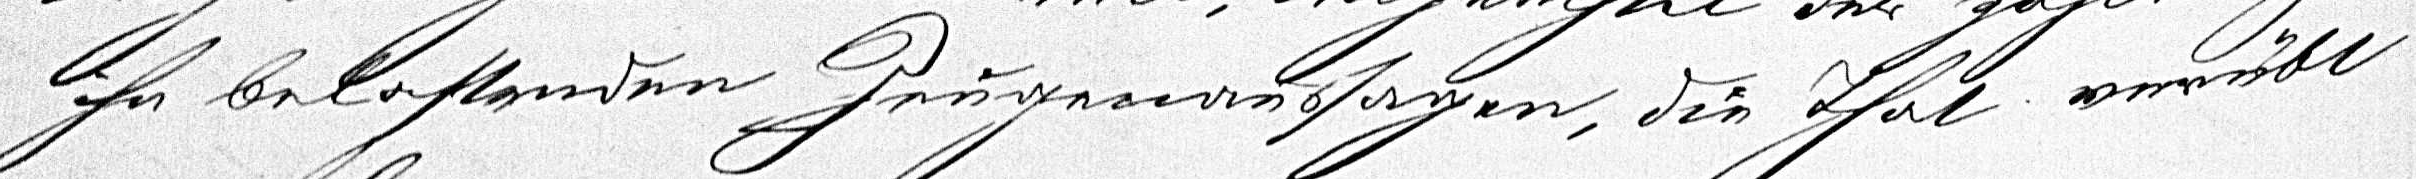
ihn belastenden Zeugenaussagen, die That verübt
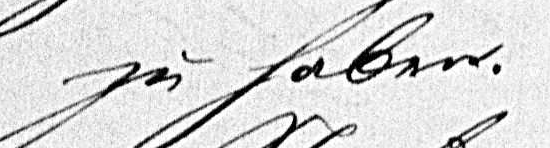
zu haben.
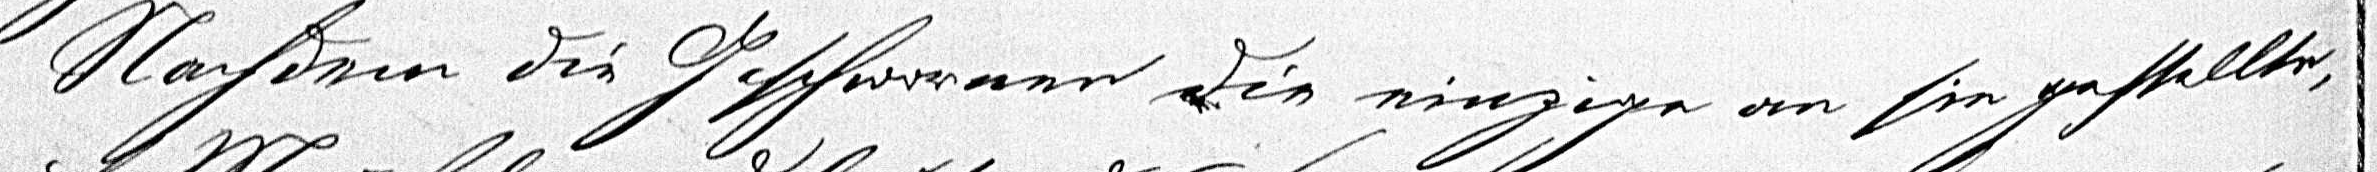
Nachdem die Geschworene die einzige an sie gestellte,
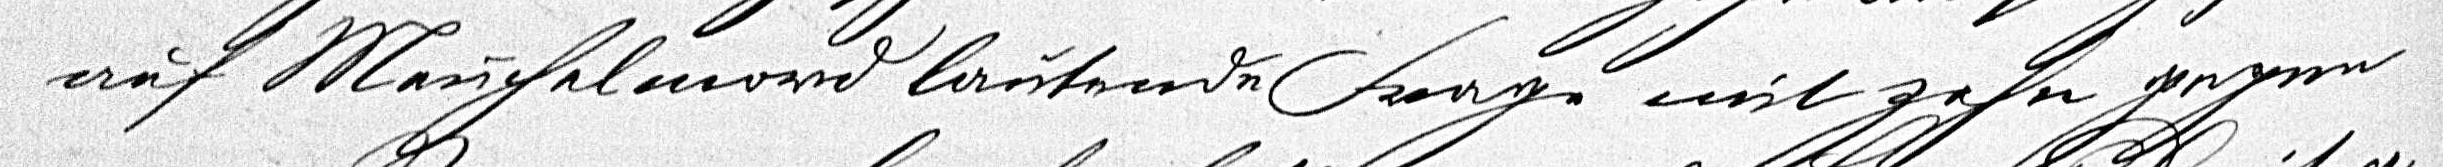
auf Meuchelmord lautende Frage mit zehn gegen
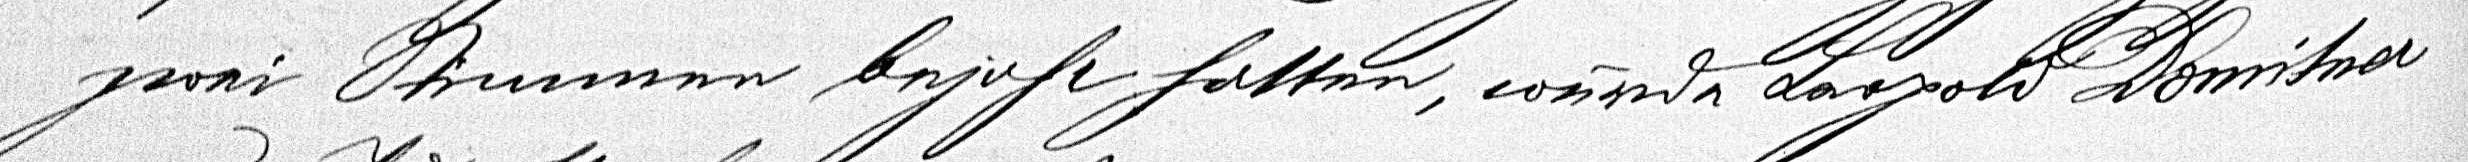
zwei Stimmen bejaht hatten, wurde Leopold Domitner
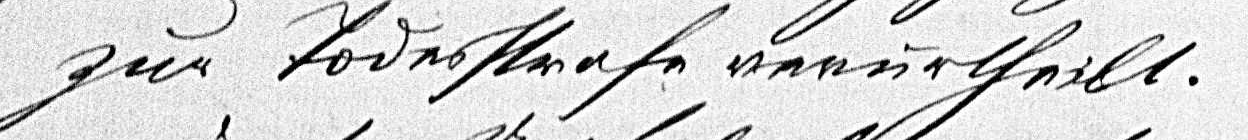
zur Todesstrafe verurtheilt.
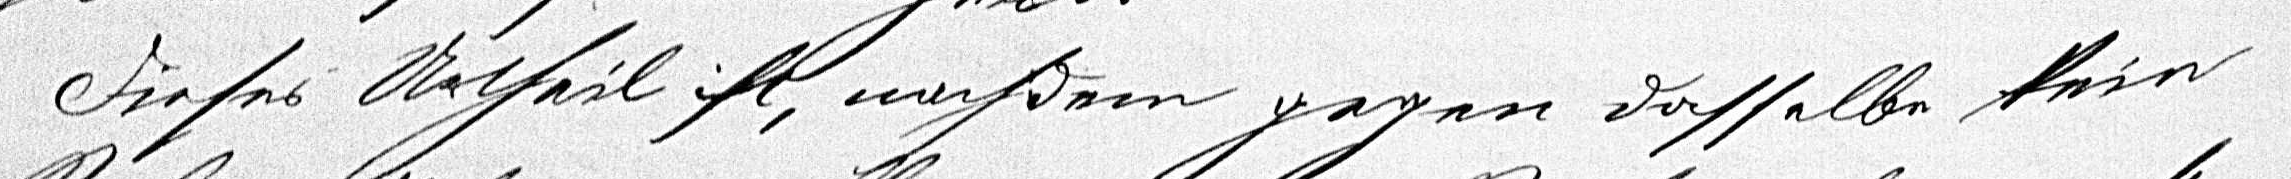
Dieses Urtheil ist, nach dem gegen dasselbe kein
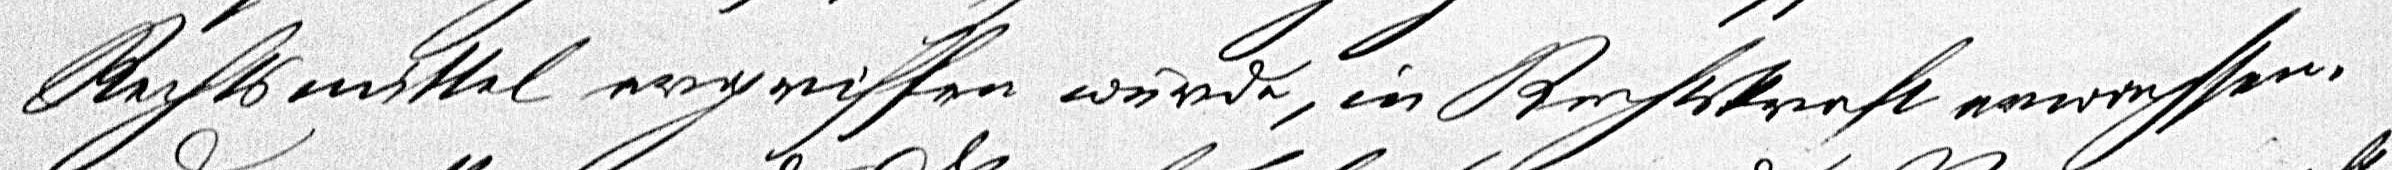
Rechtsmittel ergriffen wurde, in Rechtskraft erwachsen.
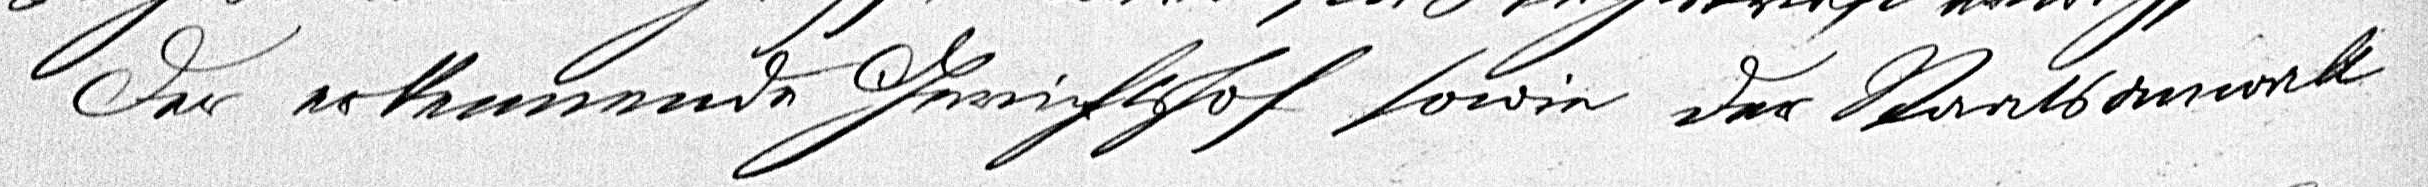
Der erkennende Gerichtshof sowie der Staatsanwalt
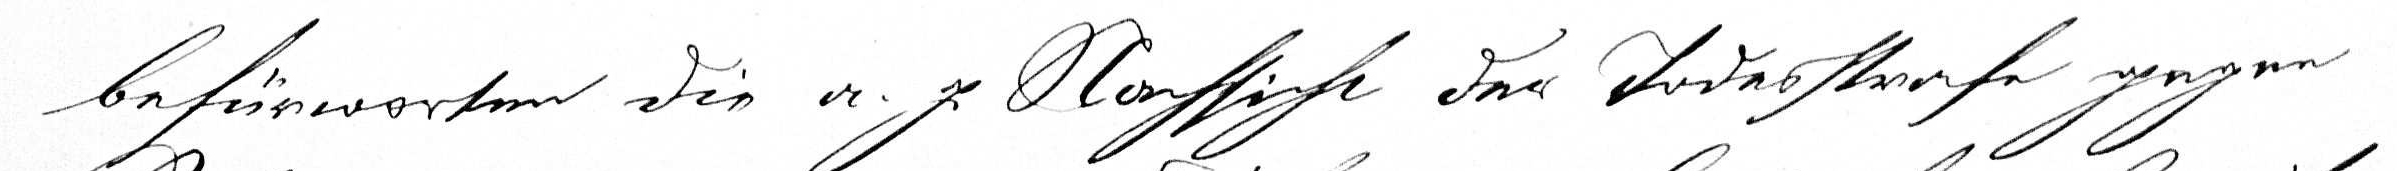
befürworten die a.g. Nachsicht der Todesstrafe gegen
